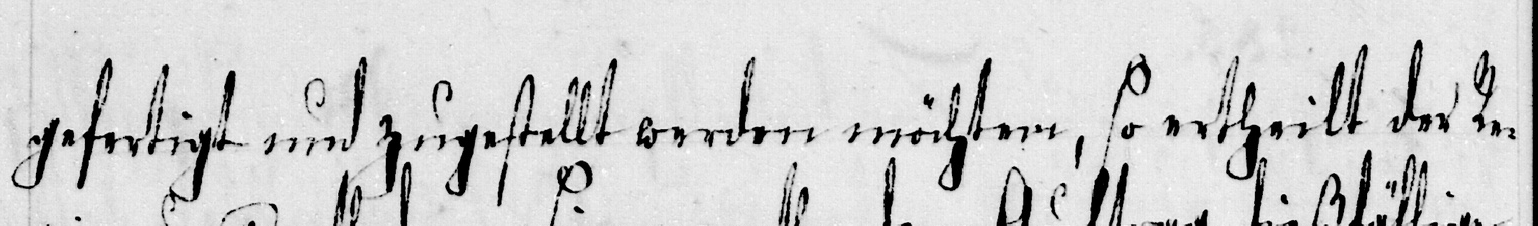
gefertigt und zugestellt werde möchten, so ertheilt der Re¬
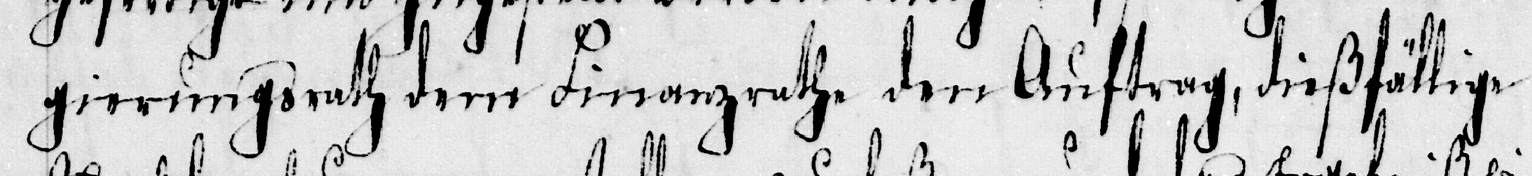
gierungsrath dem Finanzrathe den Auftrag, dießfällige
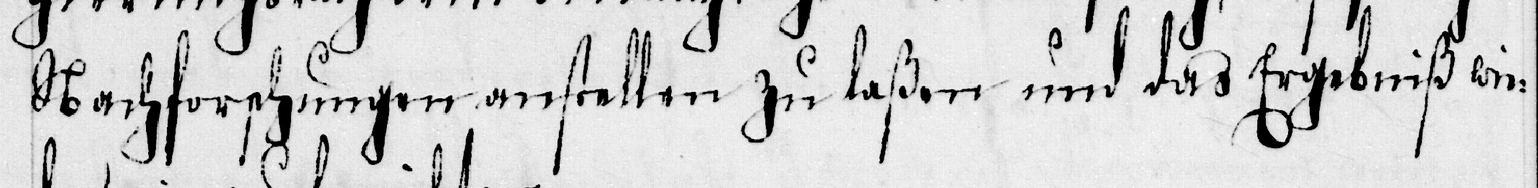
Nachforschungen anstellen zu laßen und das Ergebniß wie¬
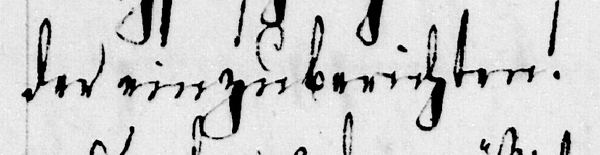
der einzuberichten.
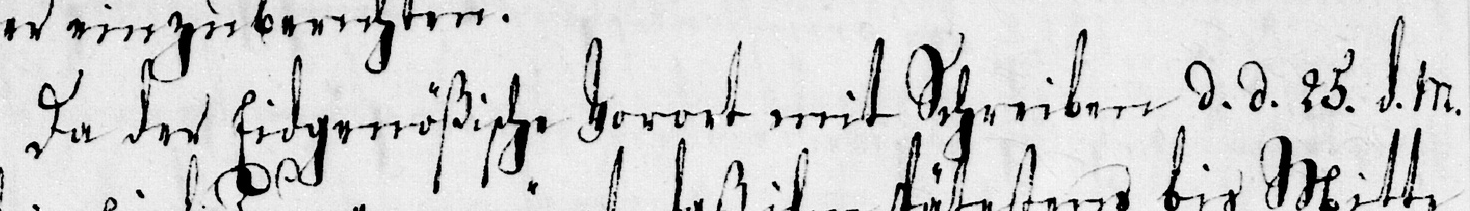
Da der Eidgenößische Vorort mit Schreiben d.d. 25. d. M.
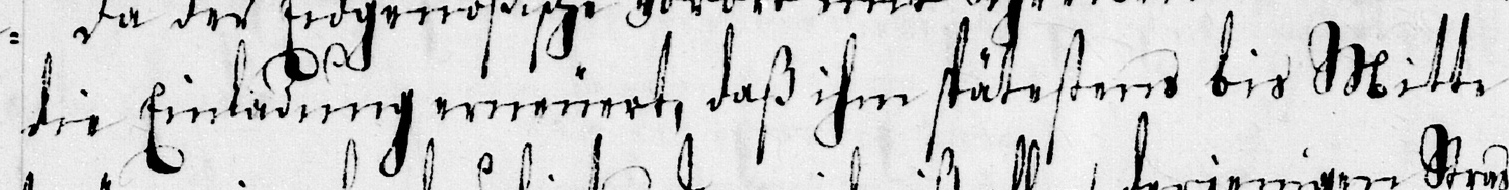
die Einladung erneuert, daß ihm spätestens bis Mitte
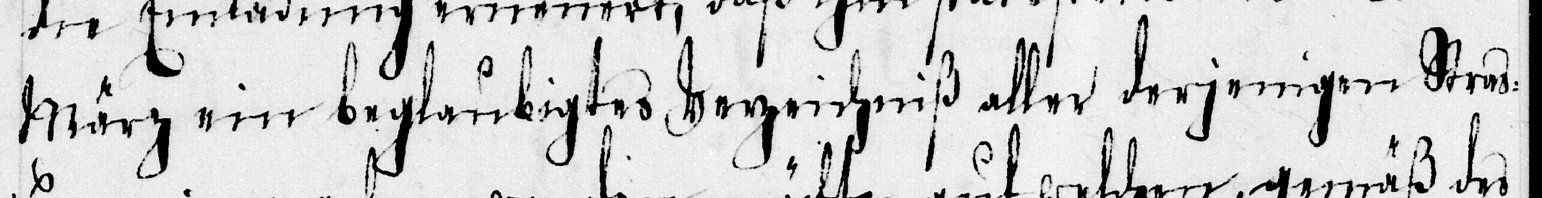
März ein beglaubigtes Verzeichniß aller derjenigen Straß¬
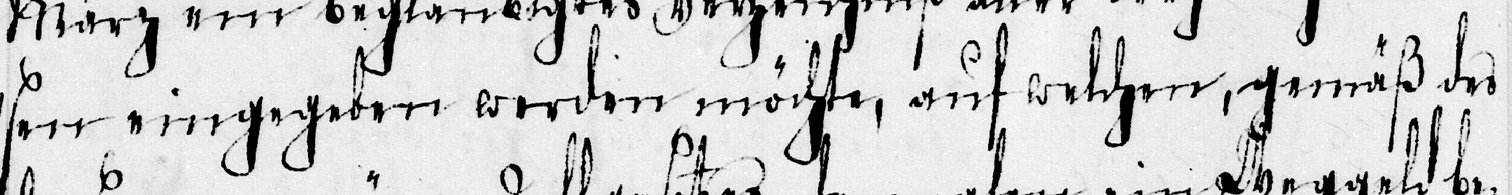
en eingegeben werden möchte, auf welchen, gemäß des
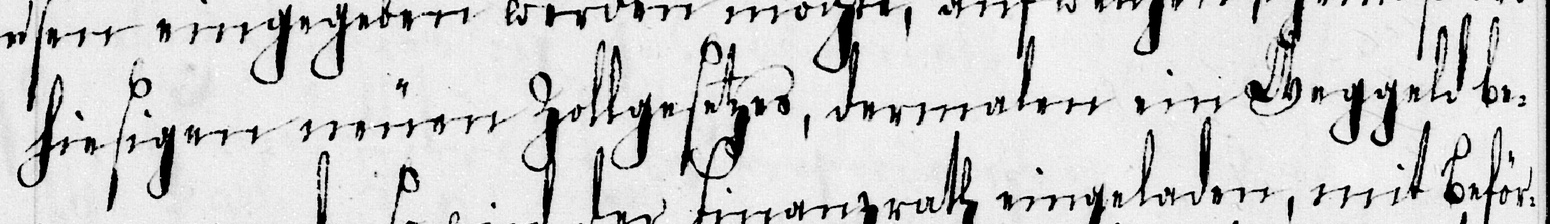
hiesigen neuen Zollgesetzes, dermalen ein Weggeld be¬
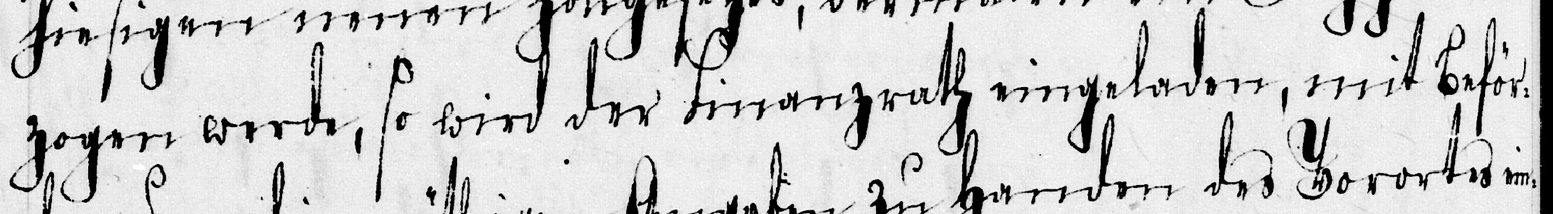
zogen werde, so wird der Finanzrath eingeladen, mit Beför¬
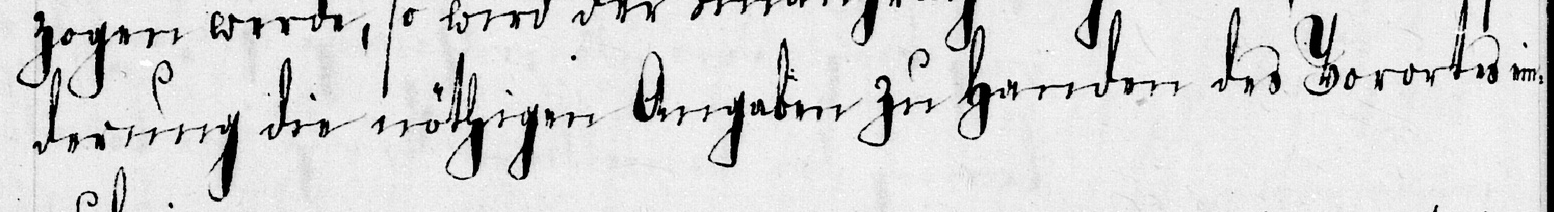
derung die nöthigen Angaben zu Handen des Vorortes e¬
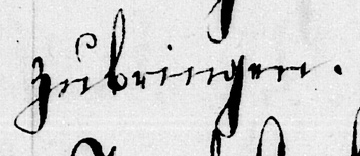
zubringen.
